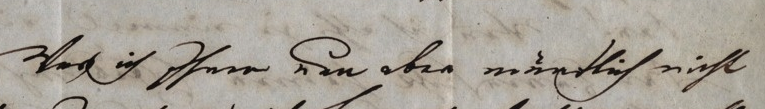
Was ich Ihnen nun aber mündlich nicht
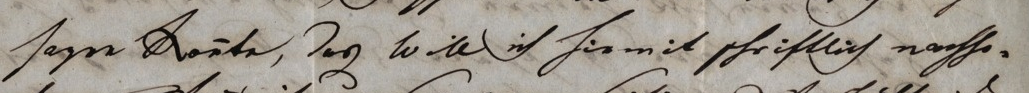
sagen konnte, das will ich hiemit schriftlich nachho-
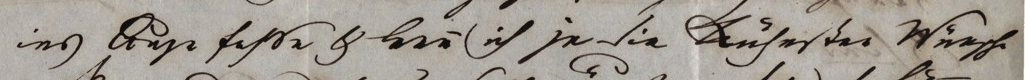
ins Auge fasse & wenn ich je die kühnsten Wünsche
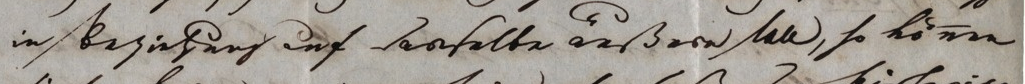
in Beziehung auf dasselbe äußern soll, so können
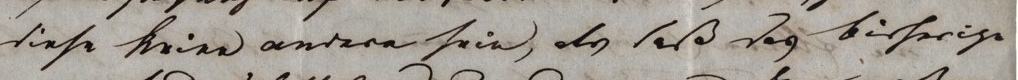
diese keine andern sein, als daß das bisherige
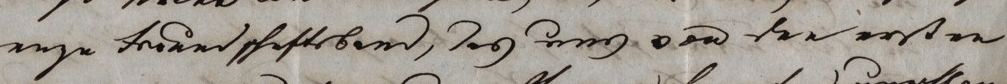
enge Freundschaftsband, das uns von den ersten
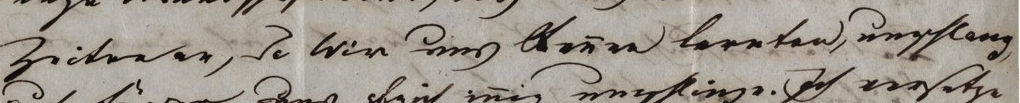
Zeiten an, da wir uns kennen lernten, umschlang,
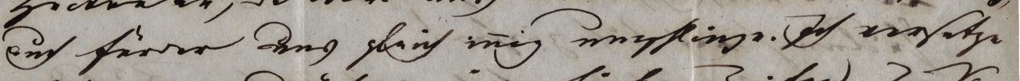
auch fürder uns gleich innig umschlinge. Ich versetze
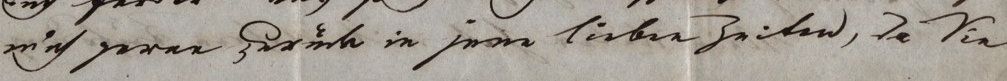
mich gerne zurück in jene lieben Zeiten, da Sie
